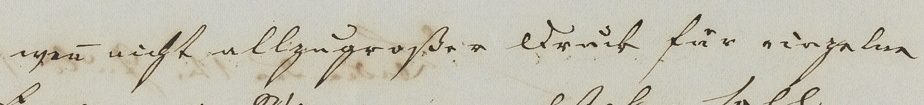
wenn nicht allzugroßer Druck für einzelne
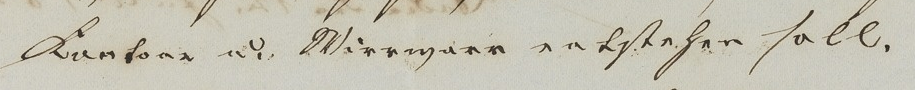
Kantone u. Wirrwarr entstehen soll.
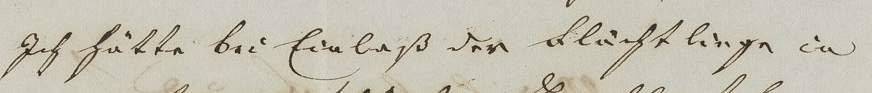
Ich hätte bei Einlaß der Flüchtlinge in
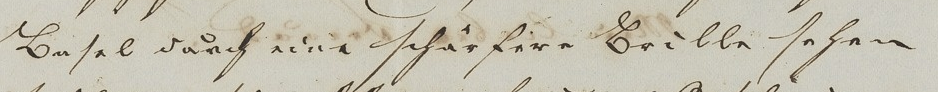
Basel durch eine schärfere Brille sehen
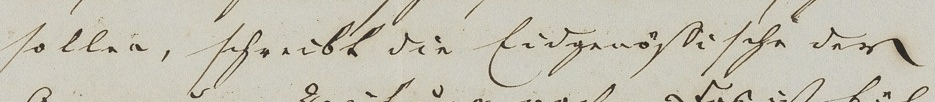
sollen, schreibt die Eidgenössische der
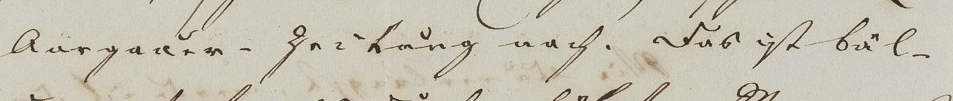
Aargauer-Zeitung nach. Das ist bäl-
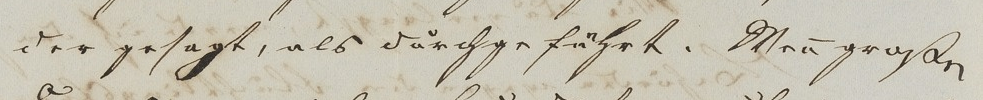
der gesagt, als durchgeführt. Wenn große
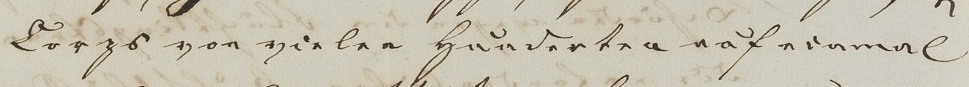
Corps von vielen Hunderten auf einmal
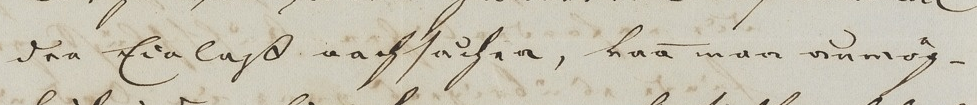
den Einlaß nachsuchen, kann man unmög-
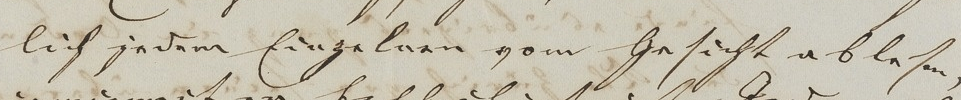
lich jedem Einzelnen vom Gesicht ablesen,
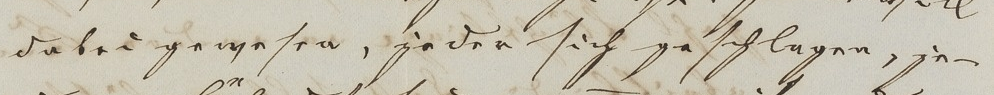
dabei gewesen, jeder sich geschlagen, je-
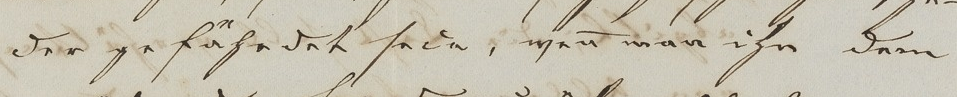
der gefährdet sein, wenn man ihn dem
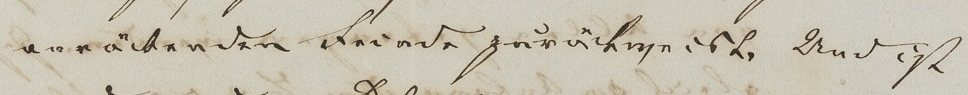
anrückenden Feinde zurückweist. Und ist
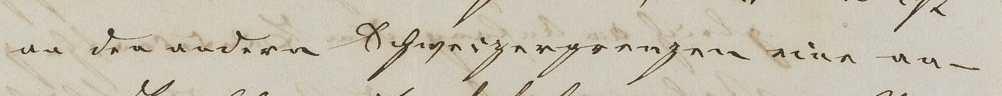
an den andern Schweizergrenzen eine an-
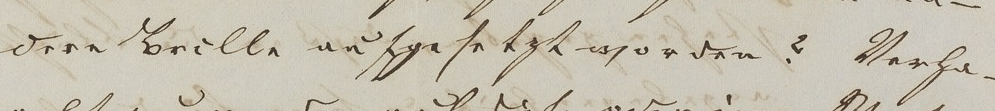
dere Brille aufgesetzt worden? Verha-
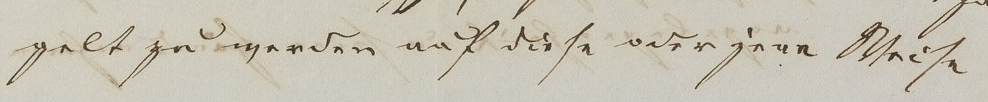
gelt zu werden auf diese oder jene Weise
